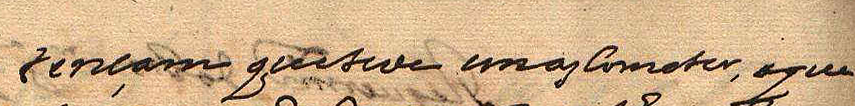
tençam que teve em as cometer, o que
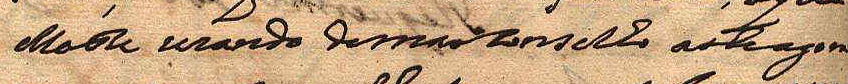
ella Re uzando de mao conselho athe agor
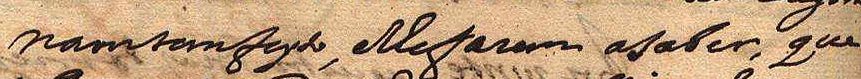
nam tem feyto, e lhe fazem a saber, que
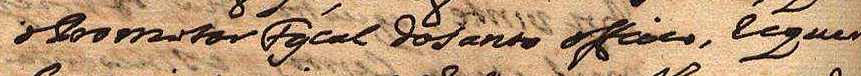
o Promotor Fiscal do santo officio, Requer
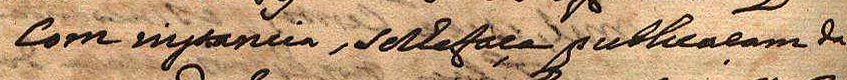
com instancia, se lhe faça publicaçam da
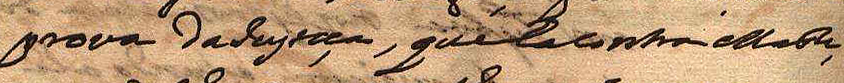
prova da Iustiça, que ha contra ella Re,
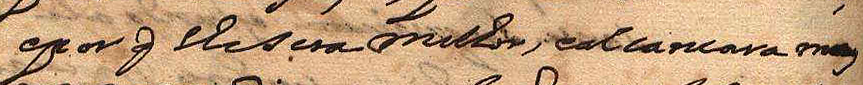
e porq̄ lhe sera melhor, e alcançara m
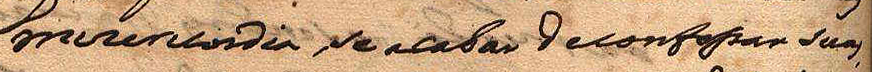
mezericordia, se acabar de confessar suas
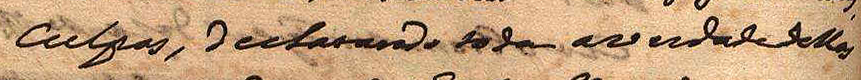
culpas, declarando toda a verdade dellas
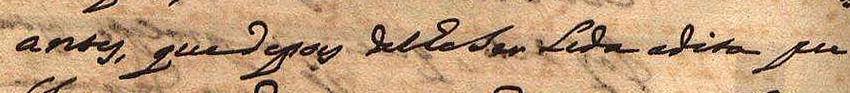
antes, que depois de lhe ser Lida a dita pu
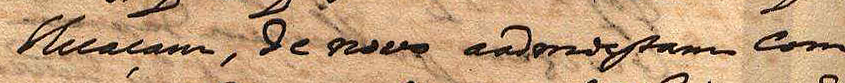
blicaçam, de novo a admoestam com
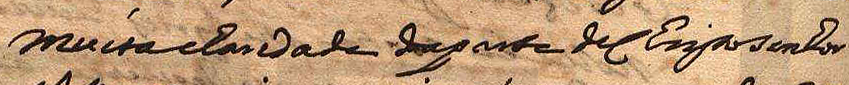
muita charidade da parte de Christo senhor
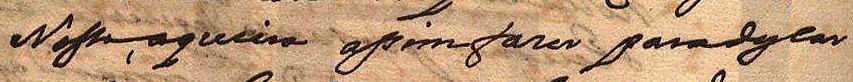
Nosso a queira assim fazer para descar
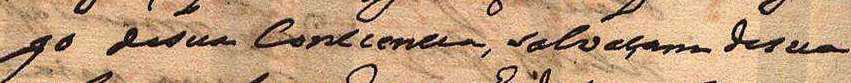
go de sua conciencia, salvaçam de sua
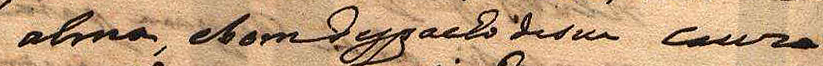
alma, e bom despacho de sua cauza
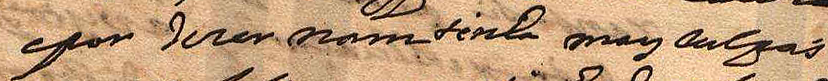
e por dizer nam tinha mais culpas
